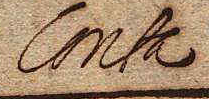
Conta
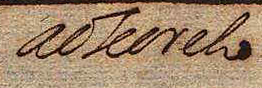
ao secreto
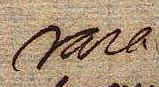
raza
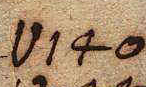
$140
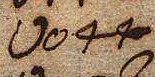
$044
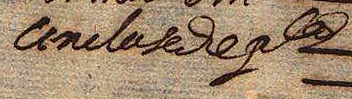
conclusos e pcor
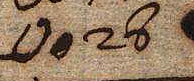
$028
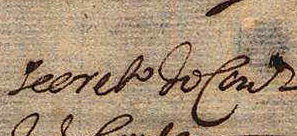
secreto do Cons
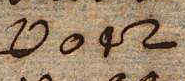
$042
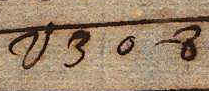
$308
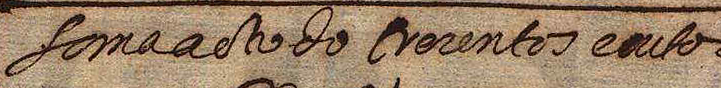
soma ao todo trezentos e outo
